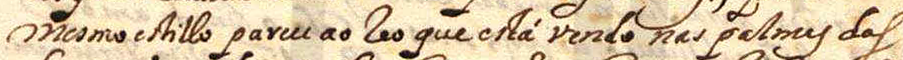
mesmo estillo parece ao Reo que está vendo nas palmes das
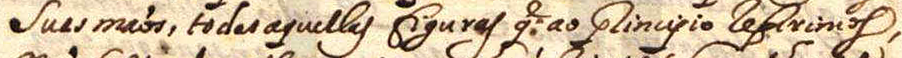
Suas maõs, todas aquellas figuras q̄ ao principio Referimos,
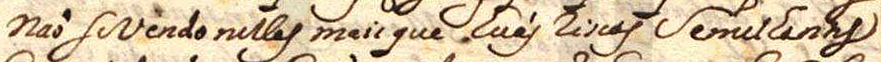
naõ se vendo nelles mais que huās Riscas Semelhantes
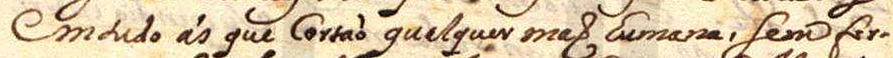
Em tudo ás que Cortaõ qualquer maõ humana: sem for
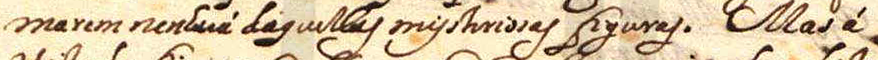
marem nenhuā daquellas mystoriosas figuras. Mas á
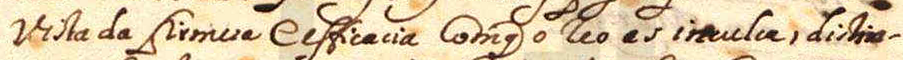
vista da firmesa E efficacia Com q̄ o Reo as inculca, distin
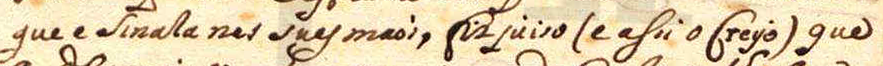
gue e sinala nas suas maõs, fiz juiso (e assi o Creyo) que
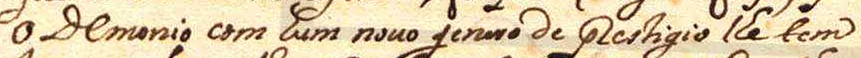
O Demonio com hum nouo genero de prestigio lhe tem
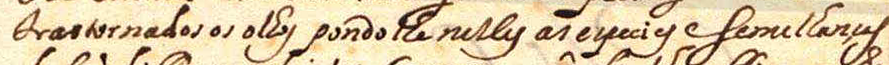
trastornado os olhos pondolhe nelles as especies e semelhanças
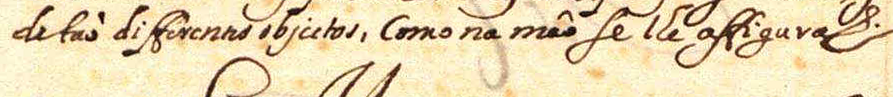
de taõ differentes objectos, como na maõ se lhe affiguraõ.
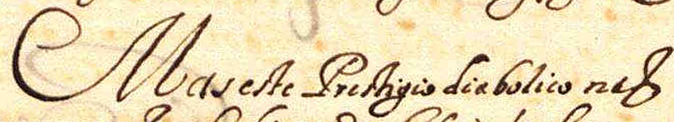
Mas este Prestigio diabolico naõ
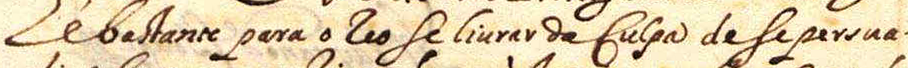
he bastante para o Reo se liurar da Culpa de se persua
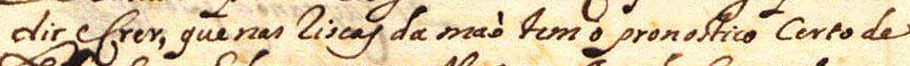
dir e Crer, que nas Riscas da maõ tem o pronostico certo de
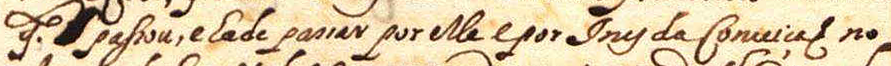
q.to passou, e hade passar por elle e por Ines da Conceiçaõ no
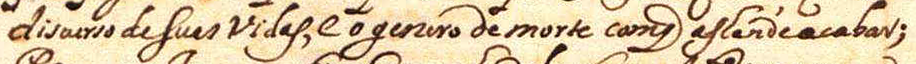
discurso de suas vidas, e o genero de morte com q̄ as hande acabar;
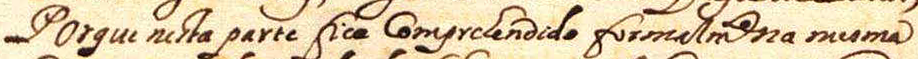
Porque nesta parte fico Comprehendido formalmte na mesma
